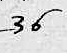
36
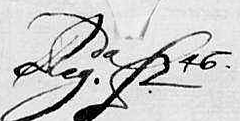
Reg.da fL. 46.
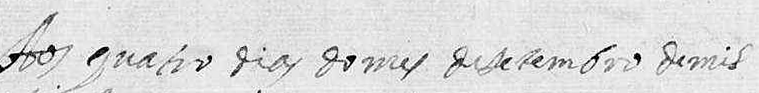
Aos quatro dias do mes de setembro de mil
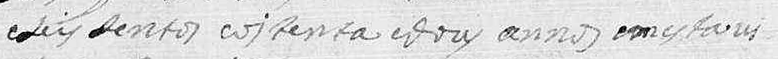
e seissentos e ojtenta e dous annos em esta ui
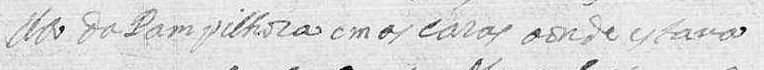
lla da Pampilhoza em as cazas aonde estaua
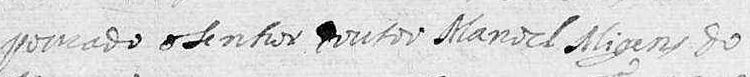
pouzado o senhor Doutor Manoel Migens do
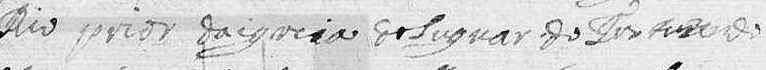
Rio prior da igreia do luguar do Tortuzendo
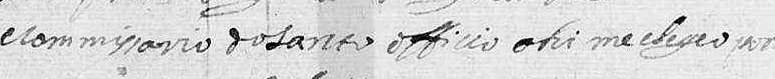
e commissario do santo officio ahi me elegeo por
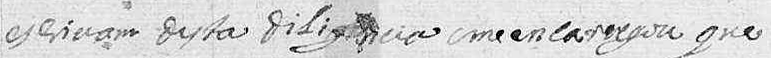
escriuam desta diligencia e me encarregou que
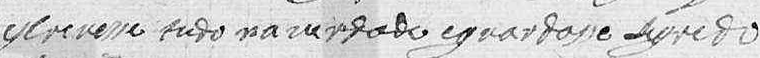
escrevesse tudo na uerdade e guardasse segredo
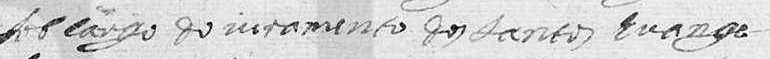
sob cargo do iuramento dos santos Euange
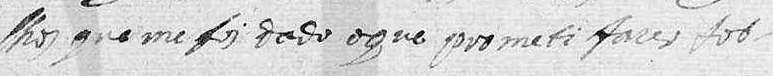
lhos que me foi dado o que prometi fazer sob
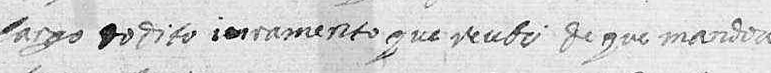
cargo do dito iuramento que recebi de que mandou
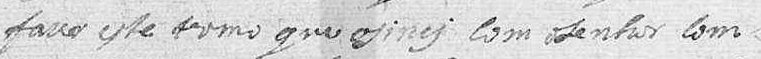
fazer este termo que asinej com o senhor com
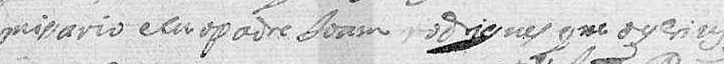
missario e eu o padre Ioam Rodrigues que o escriuj
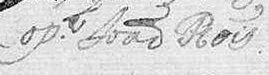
o p.e Ioaõ Roiz̄
